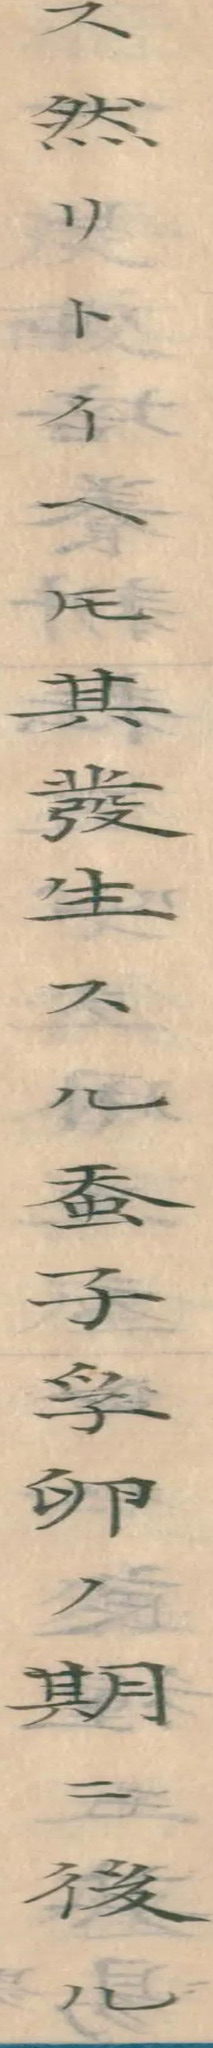ス然リトイヘトモ其発生スル蚕子孚卵ノ期ニ後ル
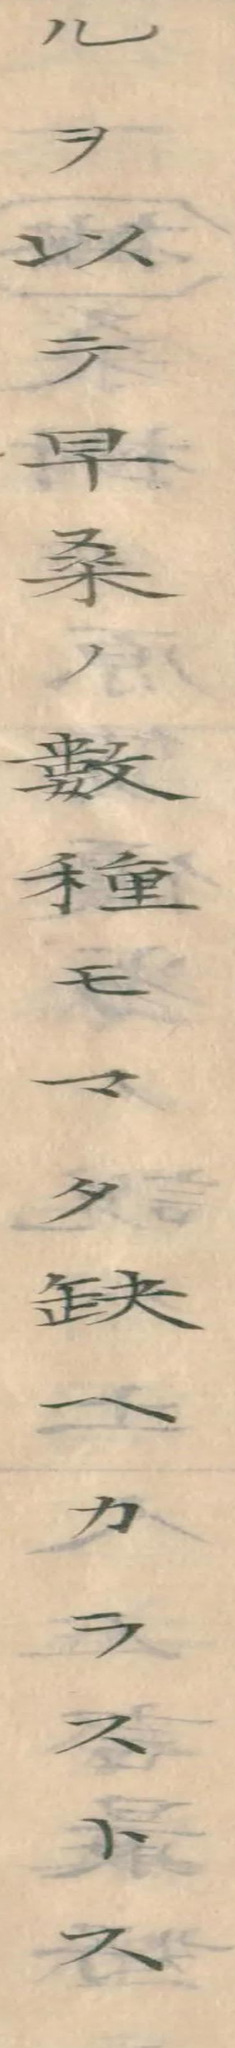ルヲ以テ早桑ノ数種モマタ缺ヘカラストスル
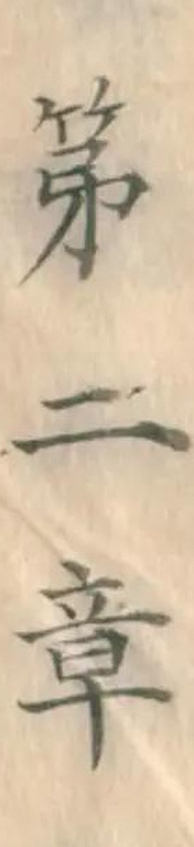第二章
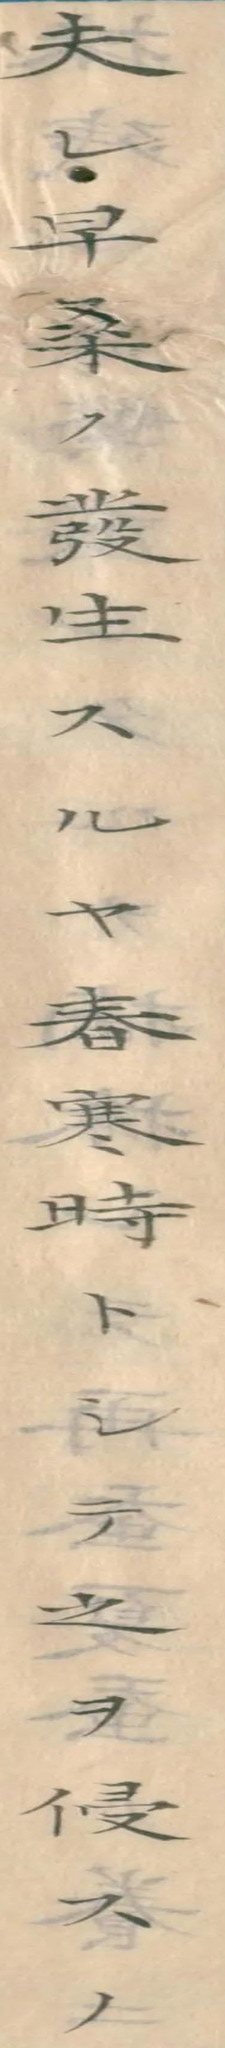夫レ早桑ノ発生スルヤ春寒時トシテ之ヲ侵スノ
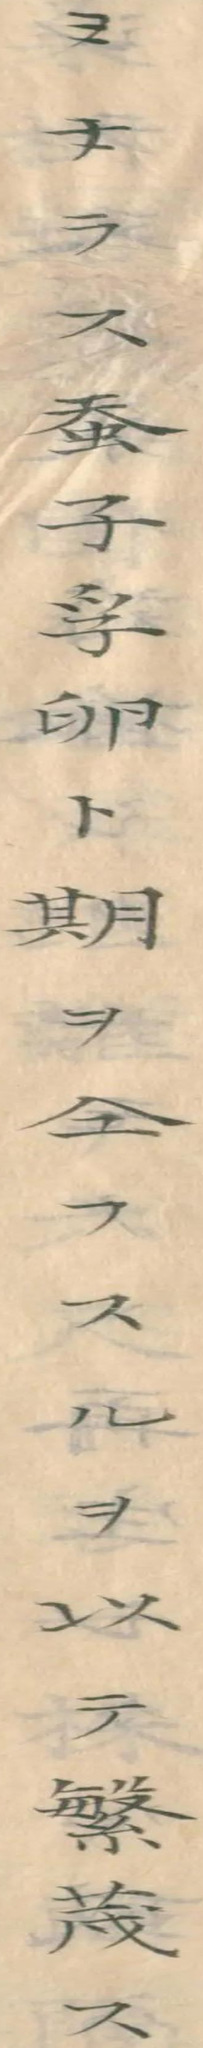ミナラス蚕子孚卵ト期ヲ仝フスルヲ以テ繁茂ス
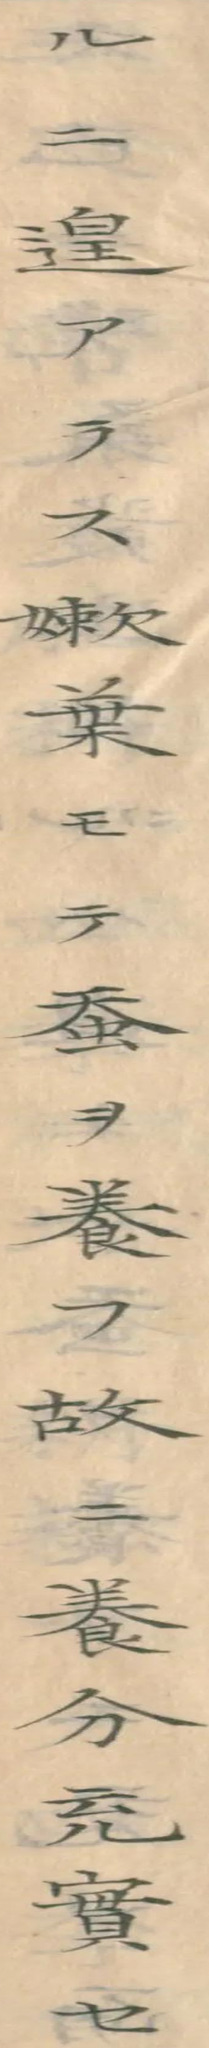ルニ遑アラス嫩葉モテ蚕ヲ養フ故ニ養分充実セ

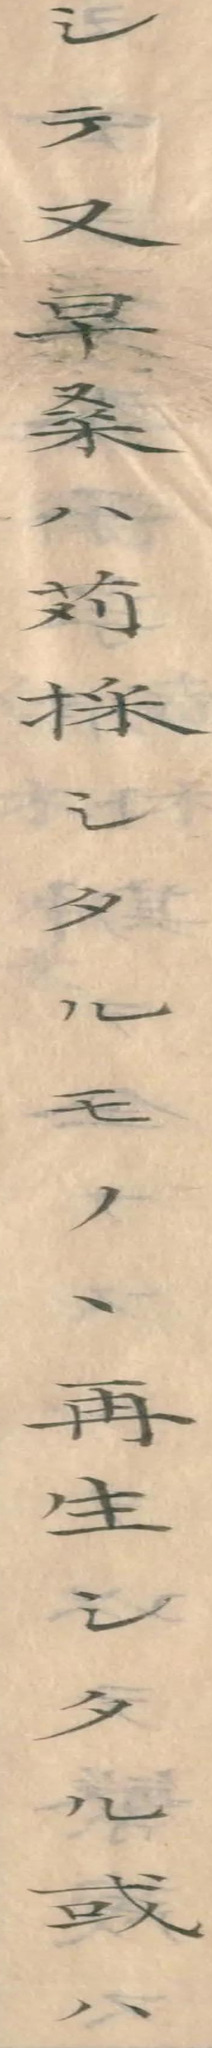シテ又早桑ハ苅採シタルモノヽ再生シタル或ハ
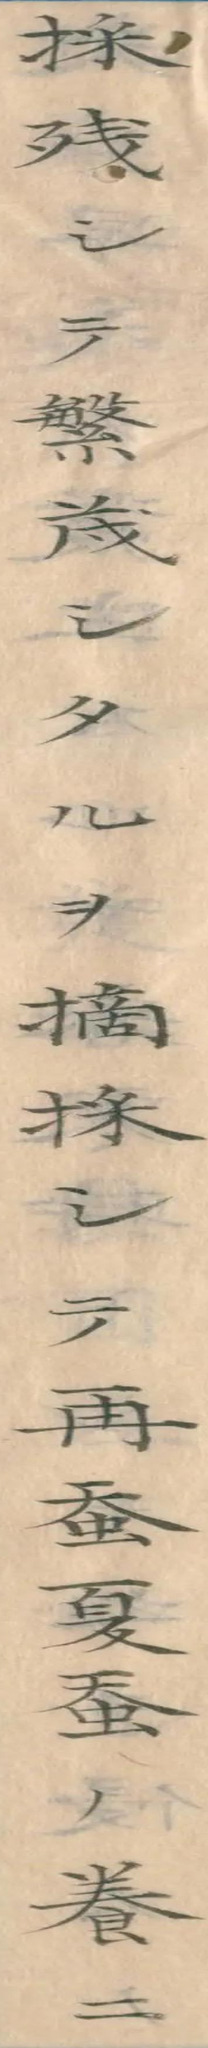採残シテ繁茂シタルヲ摘採シテ再蚕夏蚕ノ養ニ
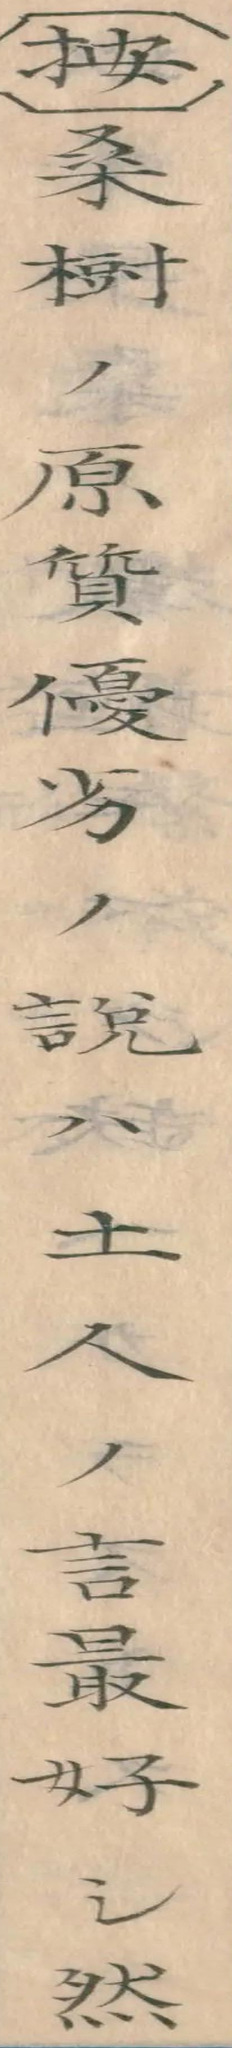[按]桑樹ノ原質優劣ノ説ハ土人ノ言最好シ然
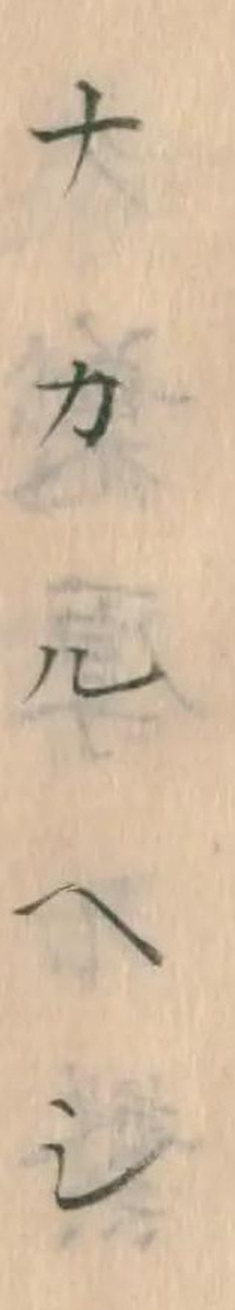ナカルヘシ
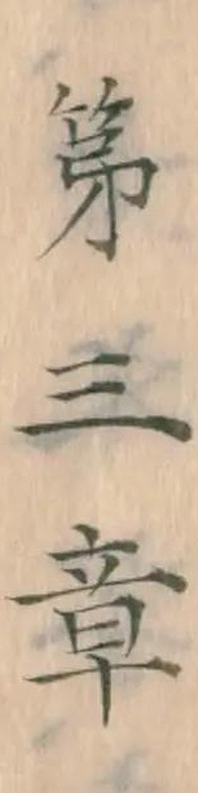第三章
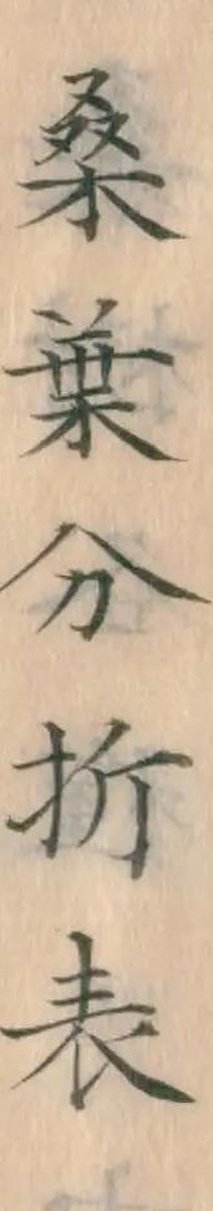桑葉分析表
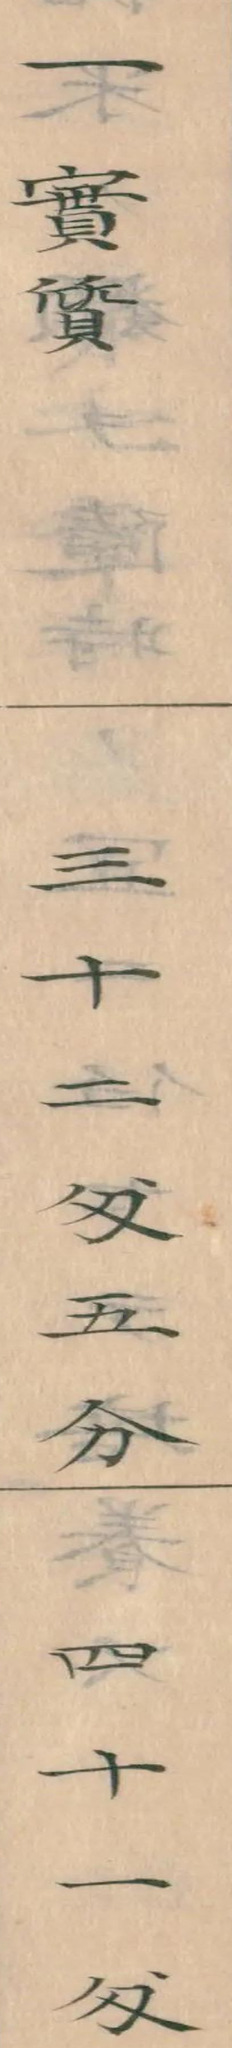一実質三十二匁五分四十一匁
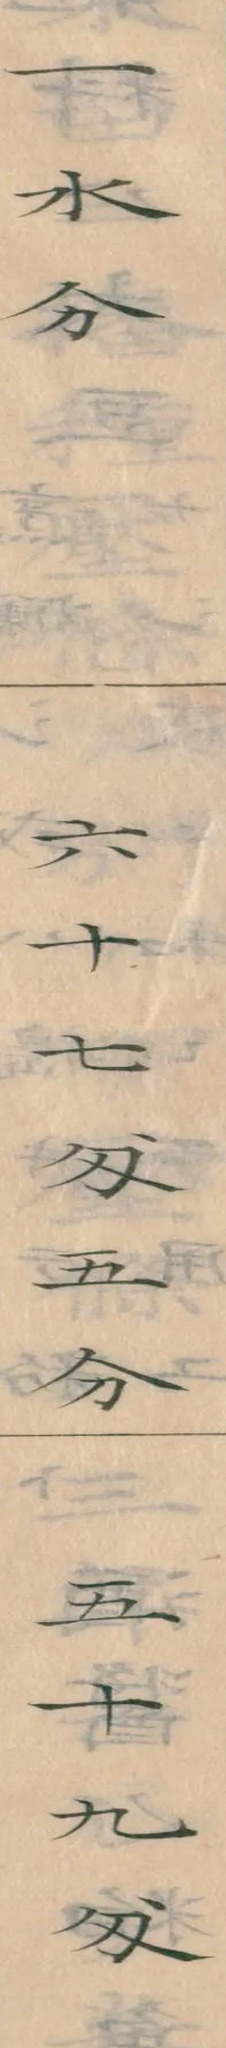一水分六十七匁五分五十九匁
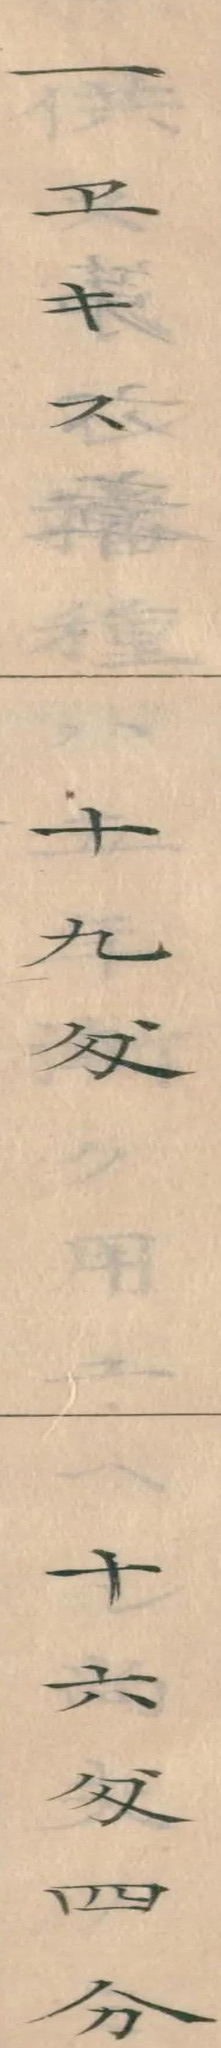一ヱキス十九匁十六匁四分
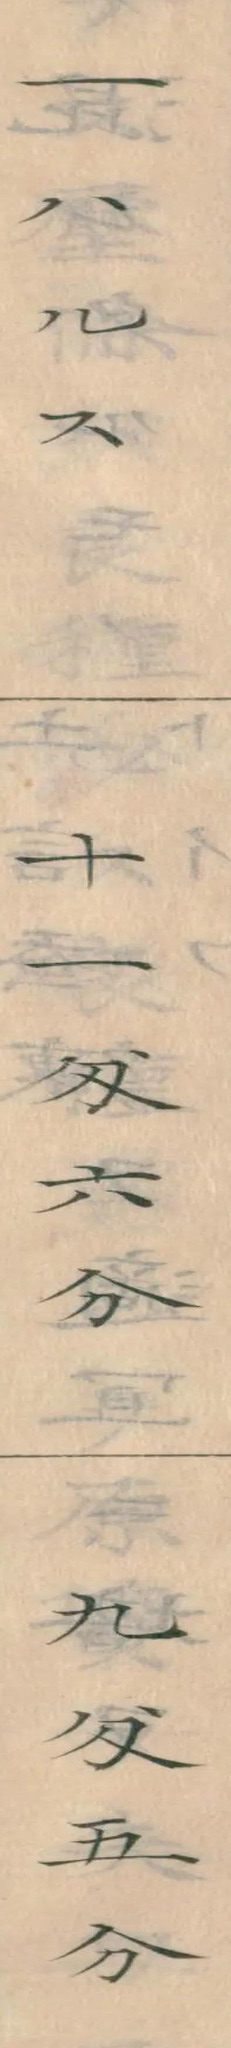一ハルス十一匁六分九匁五分
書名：蚕桑集成
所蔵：国立国会図書館 National Diet Library, JAPAN
